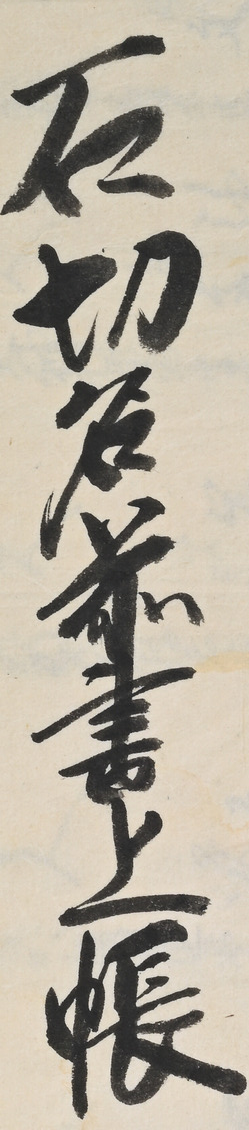石切名前書上帳

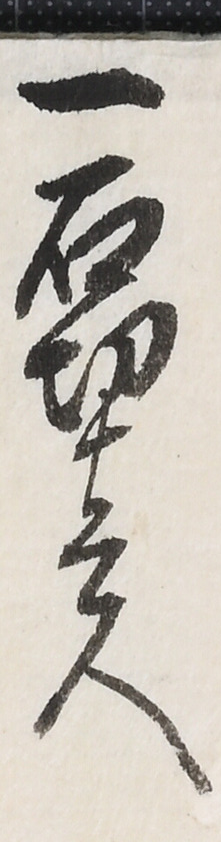一石切壱人
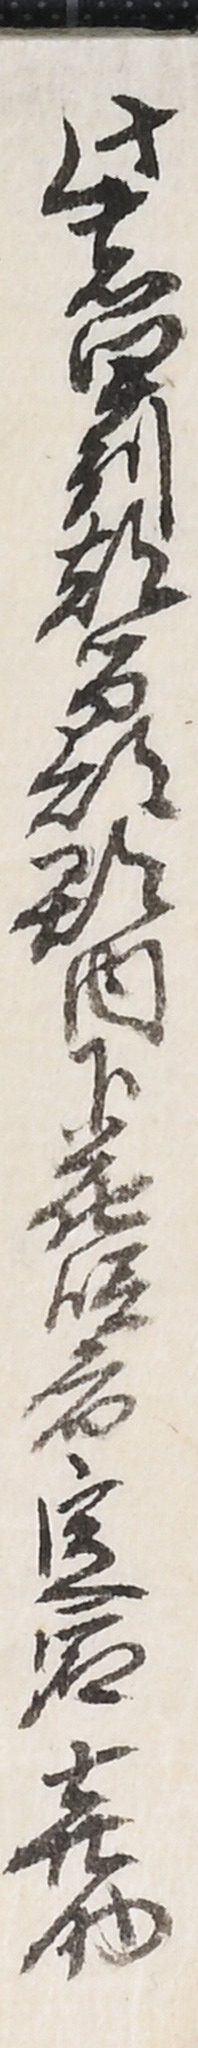此者甲州都留郡郡内下花咲宿定宿喜助
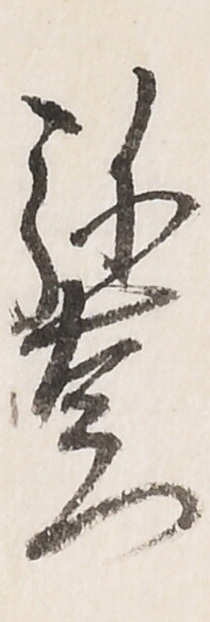弥右衛門
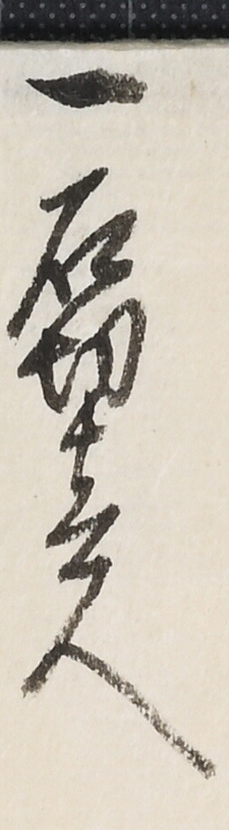一石切壱人
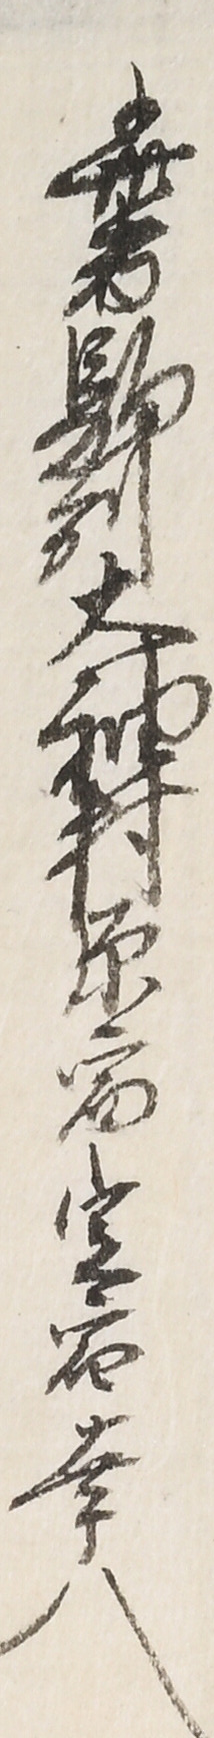此者駿州大袖村原宿定宿幸八
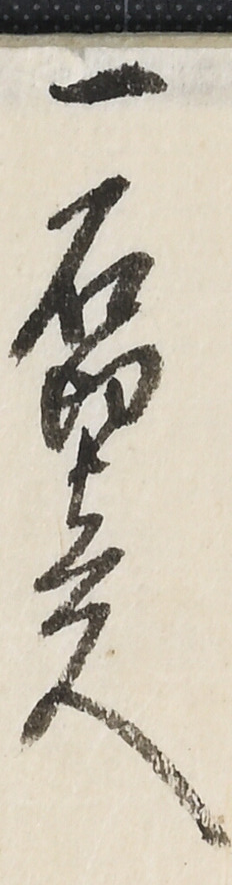一石切壱人
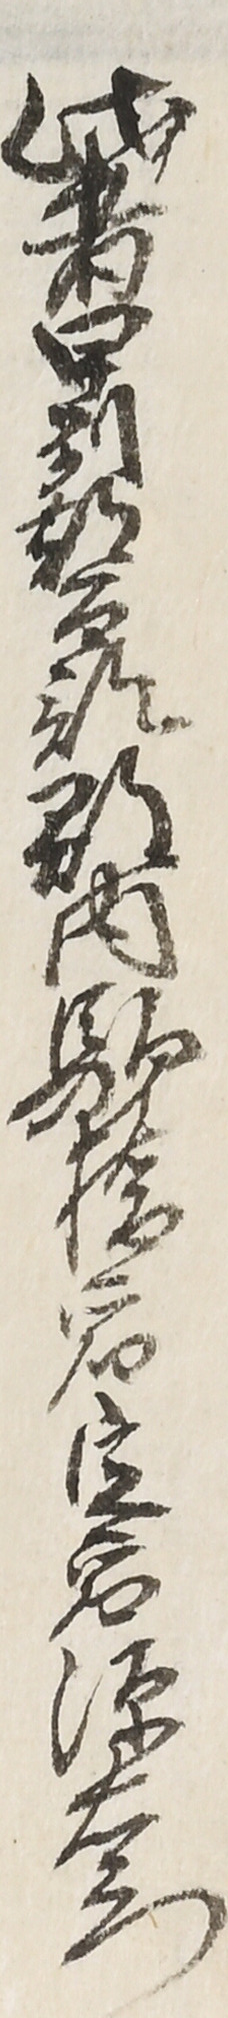此者甲州都留郡郡内駒橋宿定宿源右衛門
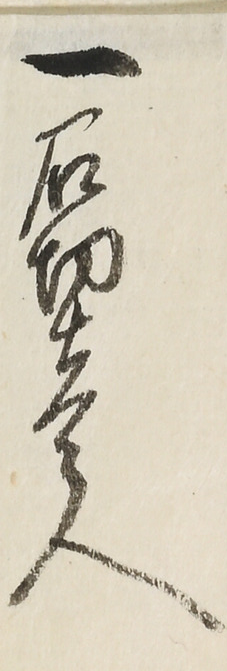一石切壱人
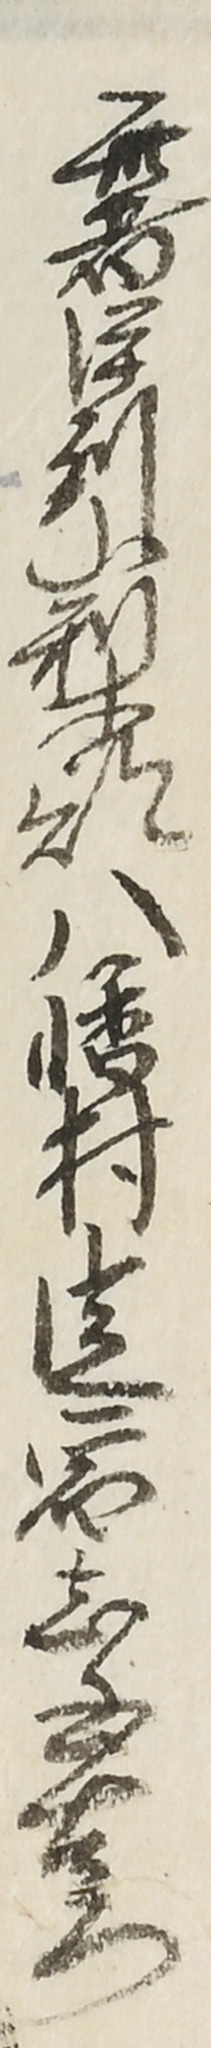此者甲州山梨郡八幡村定宿甚五右衛門
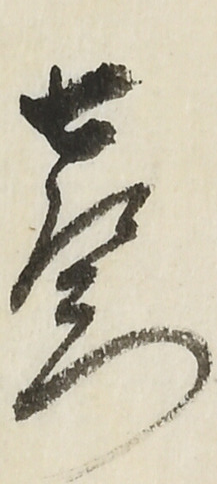七左衛門
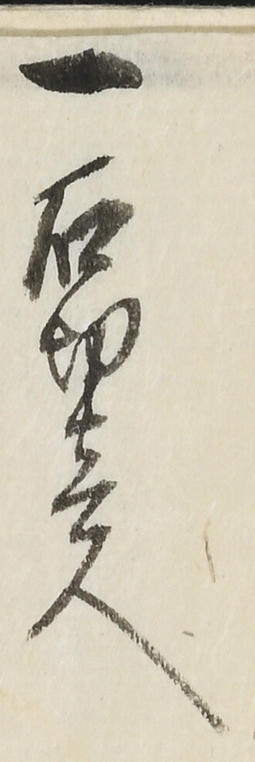一石切壱人
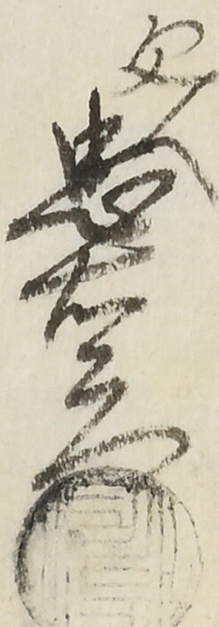弥右衛門
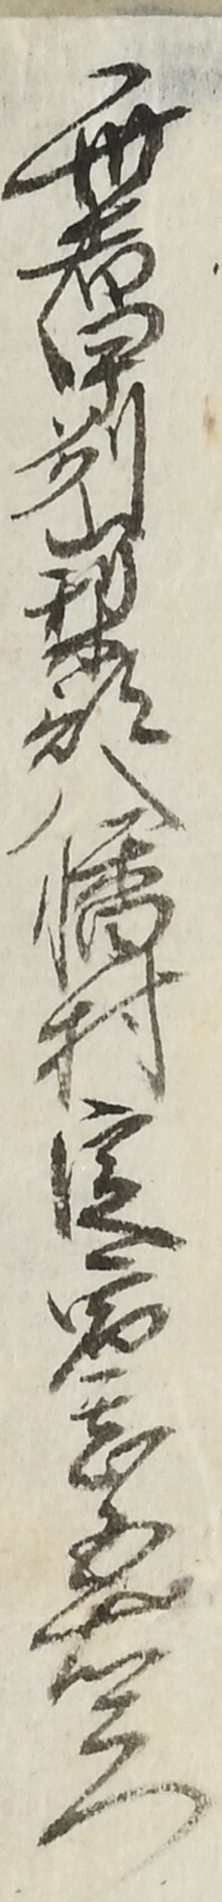此者甲州山梨郡八幡村定宿甚五右衛門

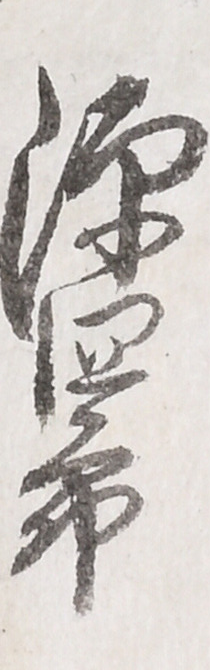源四郎
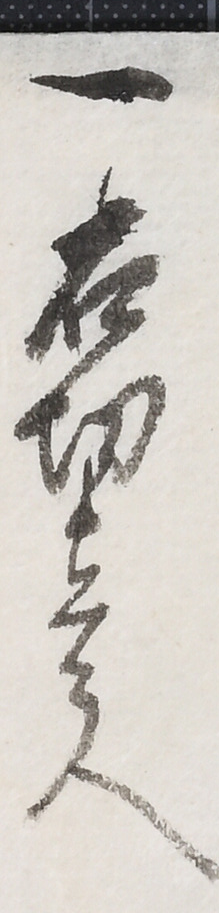一石切壱人
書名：安政六己未年二月石切名前書上帳
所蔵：伊那市立高遠町図書館・合同会社AMANE
